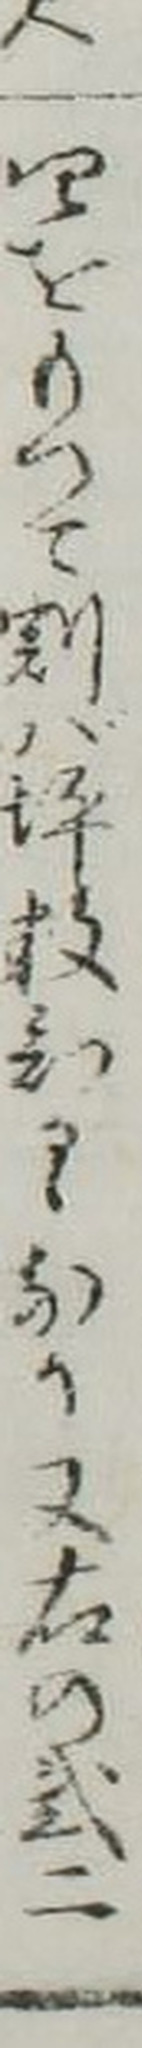四をもつて割ば坪数知るゝなり又右の弐二
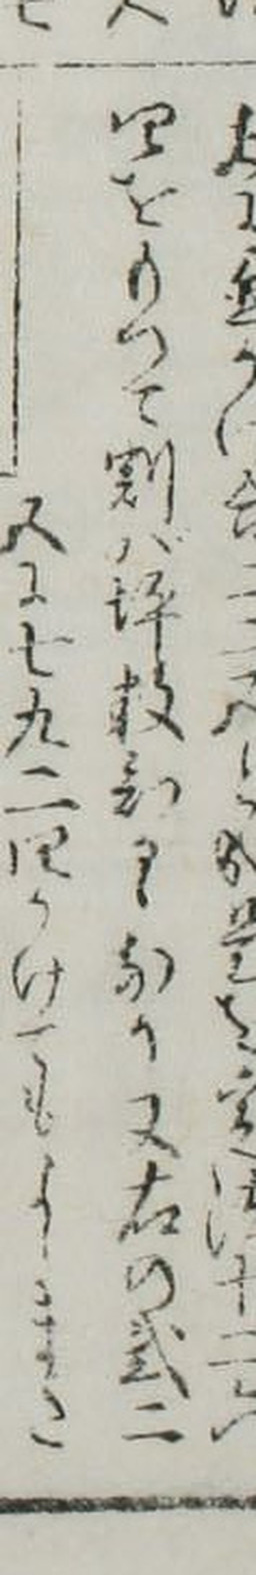四をもつて割ば坪数知るゝなり又右の弐二
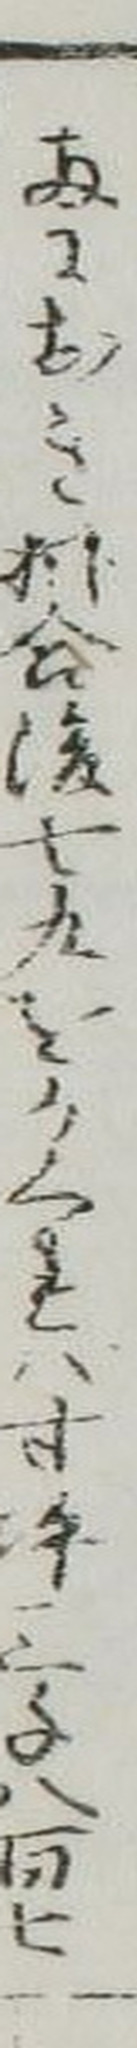両におき掛合後七九をかくれば寸坪三千八百七
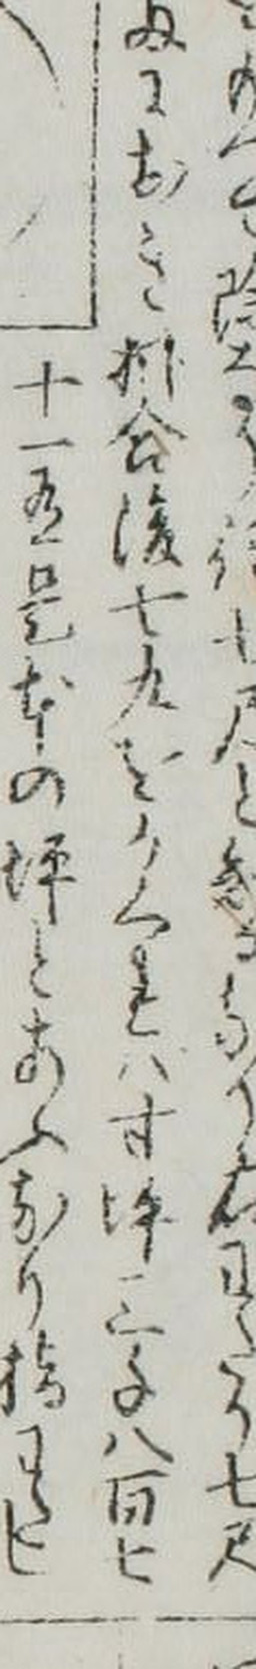両におき掛合後七九をかくれば寸坪三千八百七
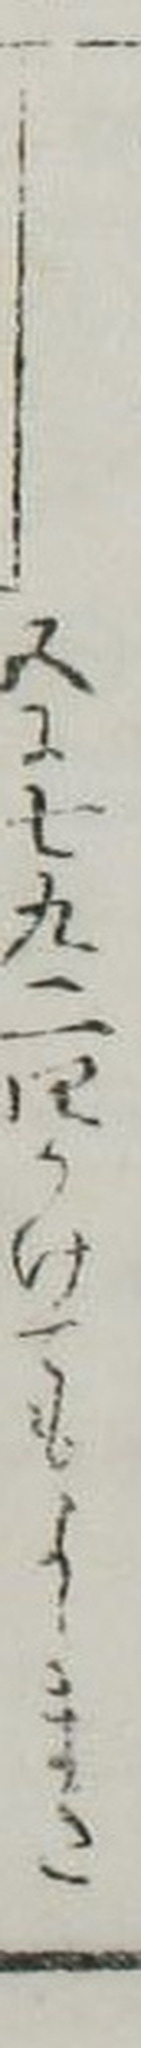五に七九二四かけてもよしまた
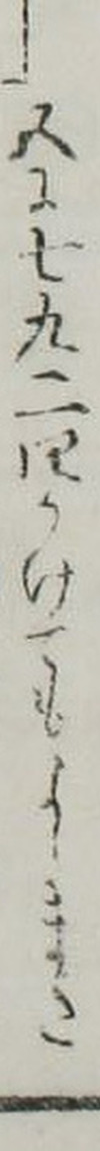五に七九二四かけてもよしまた
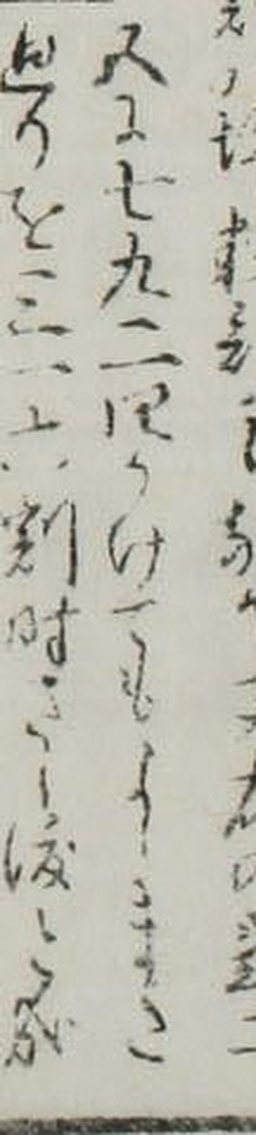五に七九二四かけてもよしまた
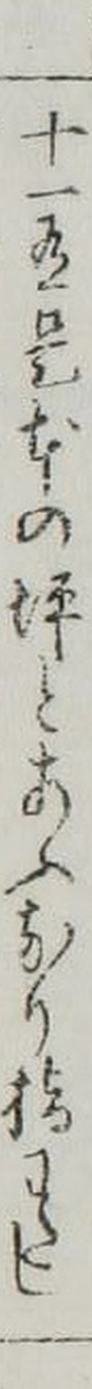十一有是本の坪とあふなり指わたし
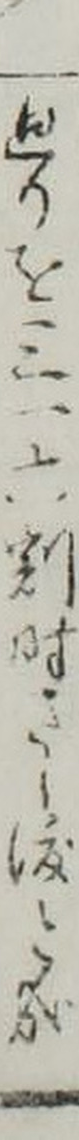廻り廻りを三一六割時さし渡と成
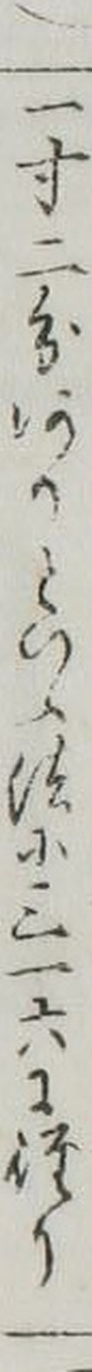七尺一寸二分ありといふ法に三一六に径り
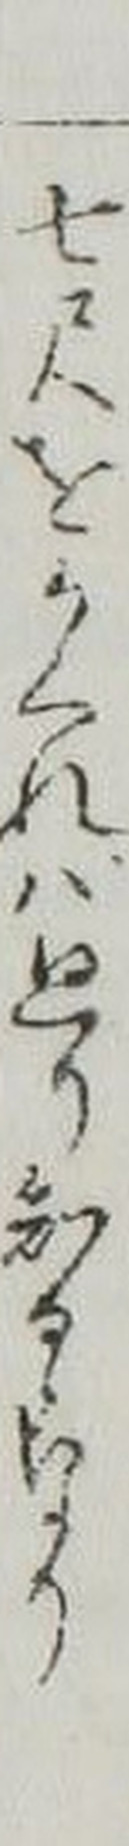七尺をかくれば廻り知るゝなり
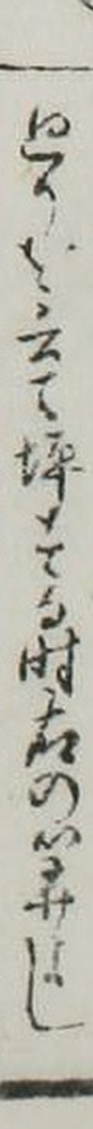八十坪廻りを云て坪する時右の算よし
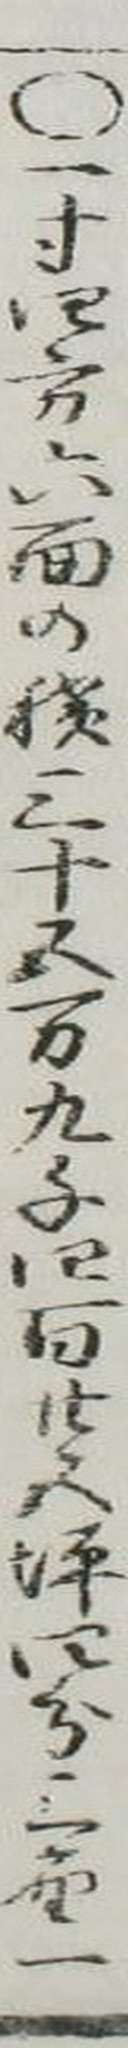○一寸四方六面の積三十五万九千四百廿五坪四分三厘一
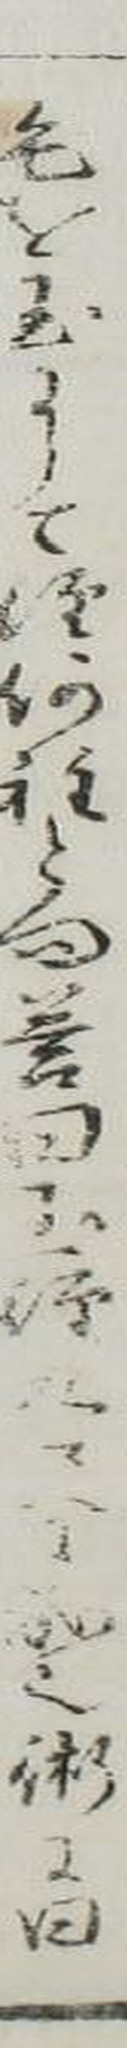毛を玉にして径何程と問答曰玉径九尺に成也術に曰
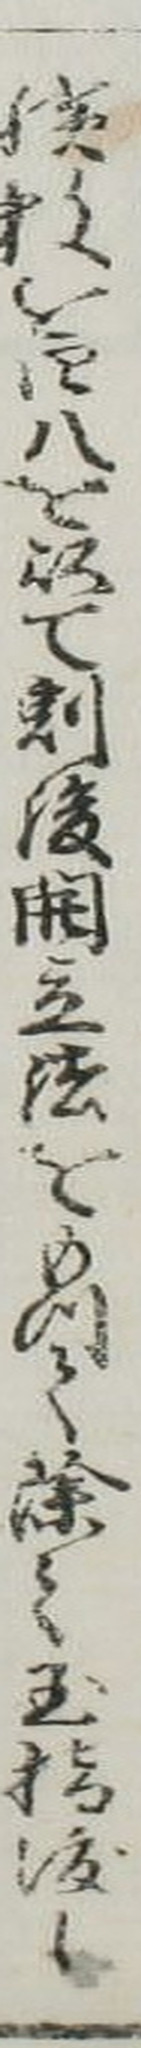さし渡し積数を四八を以て割後開立法をもつて徐之玉指渡し
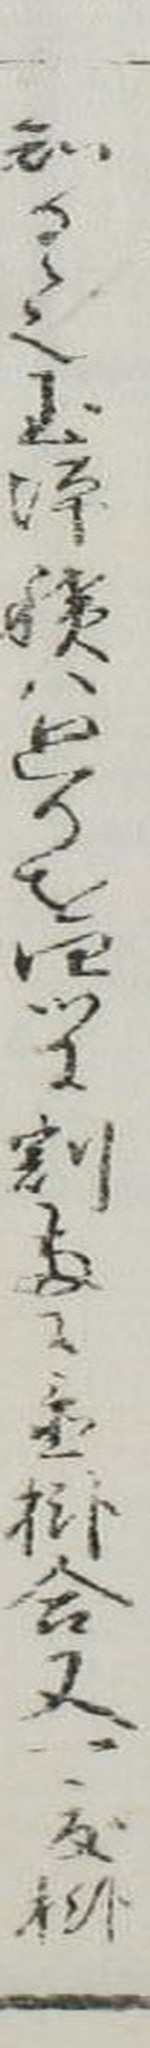玉九尺知るゝ也玉坪積は廻りを四ツに割両に置掛合又一度掛
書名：宝玉塵劫記
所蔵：東京学芸大学教育コンテンツアーカイブ
